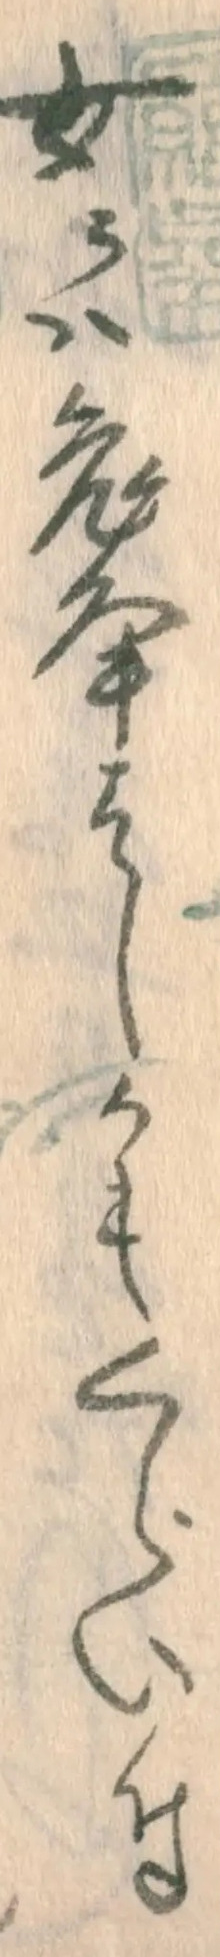女には兎角はしかもくらい付
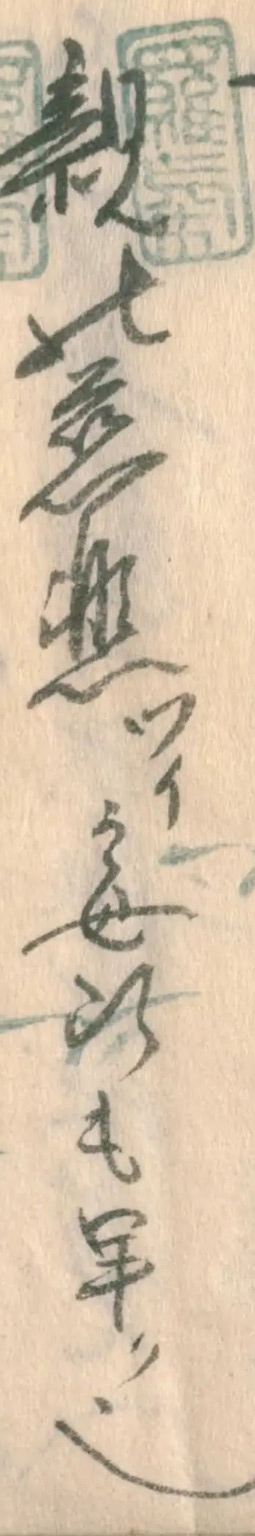親の慈悲ツイ毒断も早く也
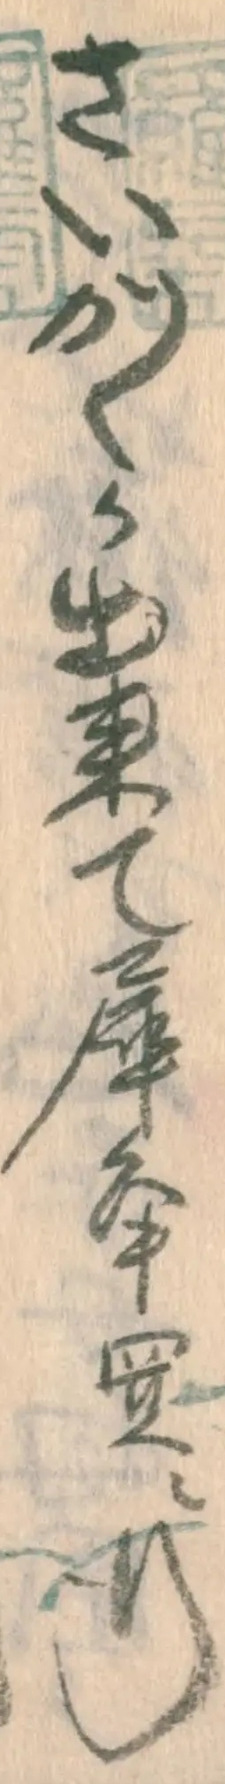さいかくが出来て犀角買に行
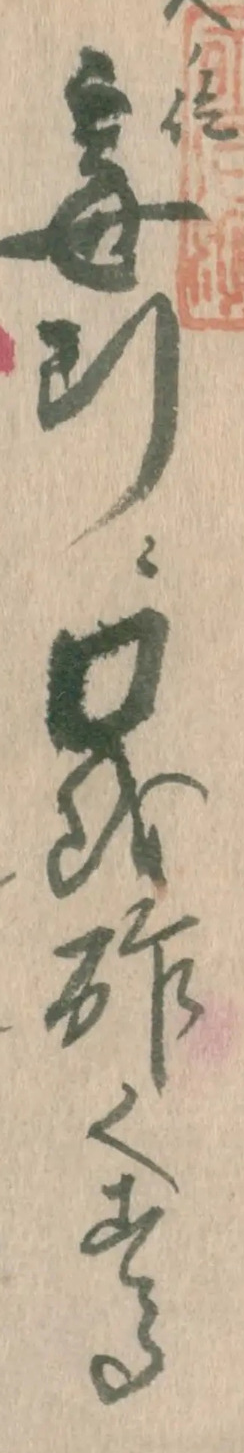毒断に口を酢くする
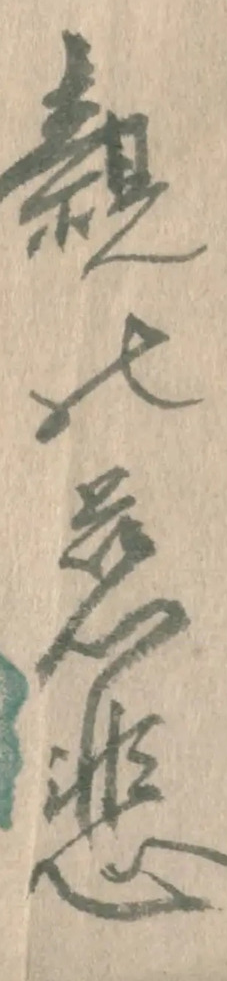親の慈悲
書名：麻疹後柳樽
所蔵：国立国会図書館 National Diet Library, JAPAN
